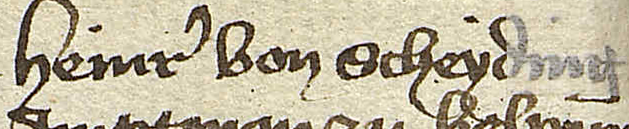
Heinr* von Scheyding
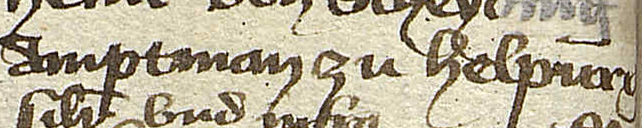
Amptman cʒu helpurg
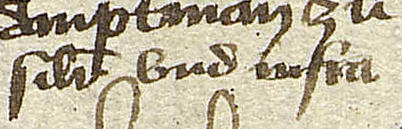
ſilr* vnd infra
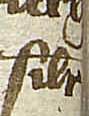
ſilr*
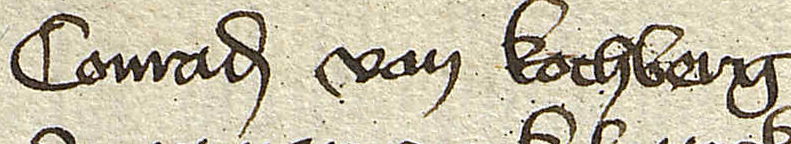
Conrad von Kochberg
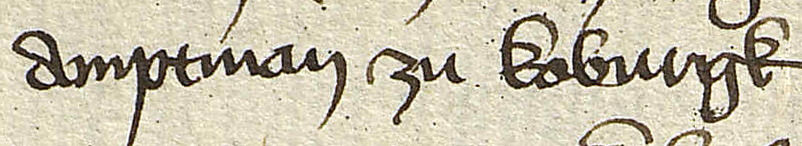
Amptman cʒu Koburgk
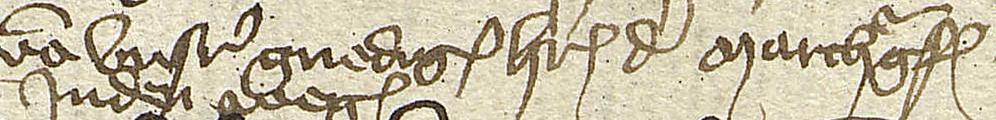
vo* vnſr* gnedig* hr* d* Marchg*f*
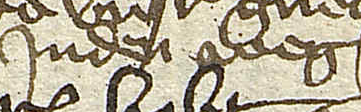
Iuden weg*
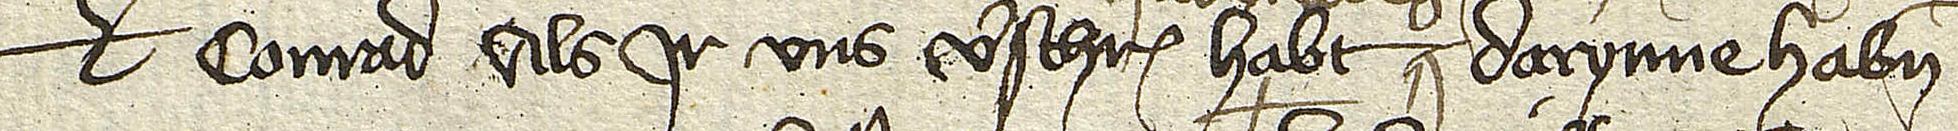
L* Conrad Als Ir vns v*ſchr* habt / darynne habn*
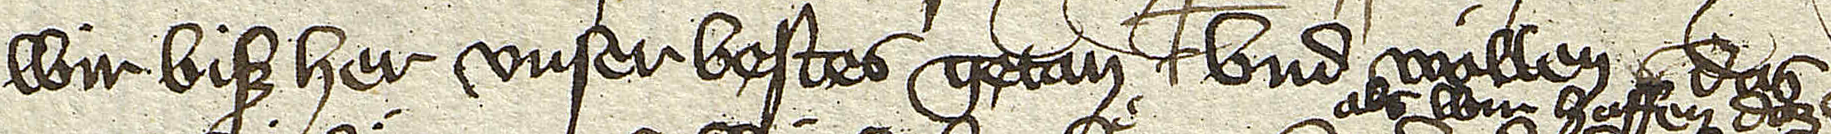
wir biſʒ her vnſer beſtes getan / vnd wöllen / das
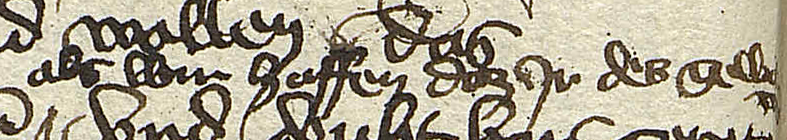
als wir hoffen daʒ Ir des gew
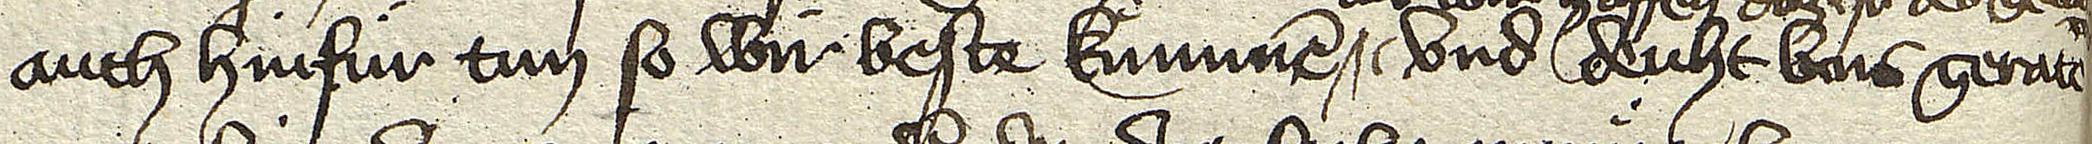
auch hinfür tun ſo wir beſte kümme* / vnd deuht vns gerate*
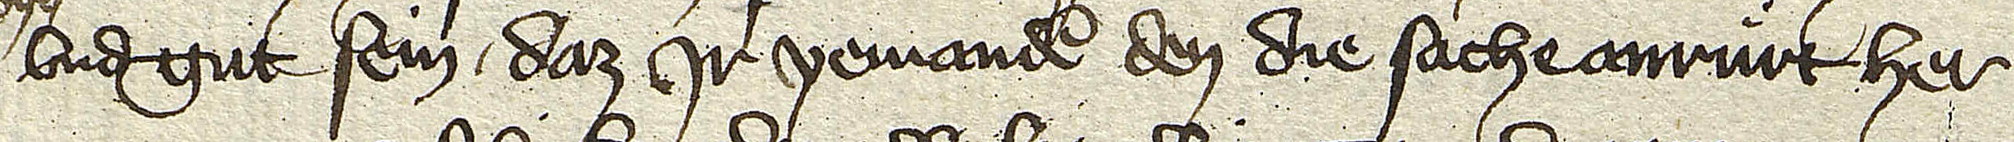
vnd gut ſein / daʒ Ir yemand* den die ſache anrürt her
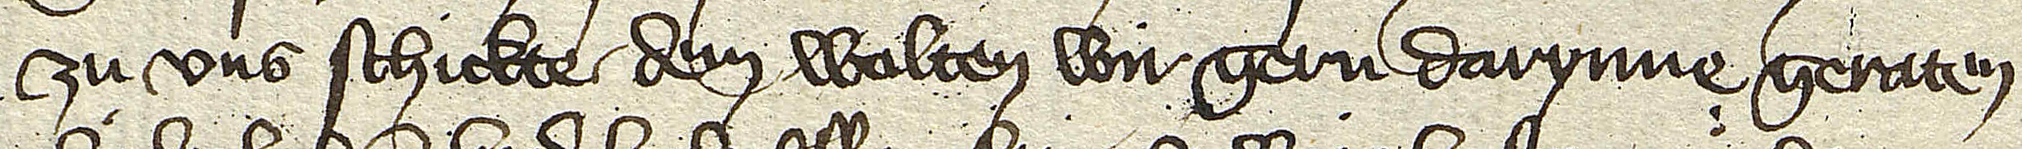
cʒu vns ſchickte / dem wolten wir gern darynne geraten
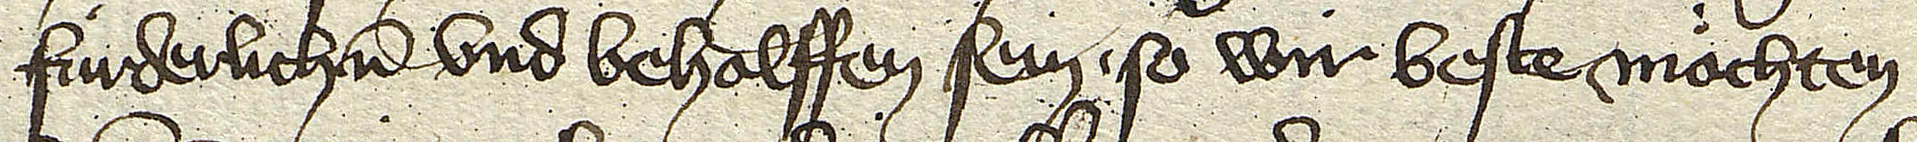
fürderlichn* vnd beholffen ſein / ſo wir beſte möchten
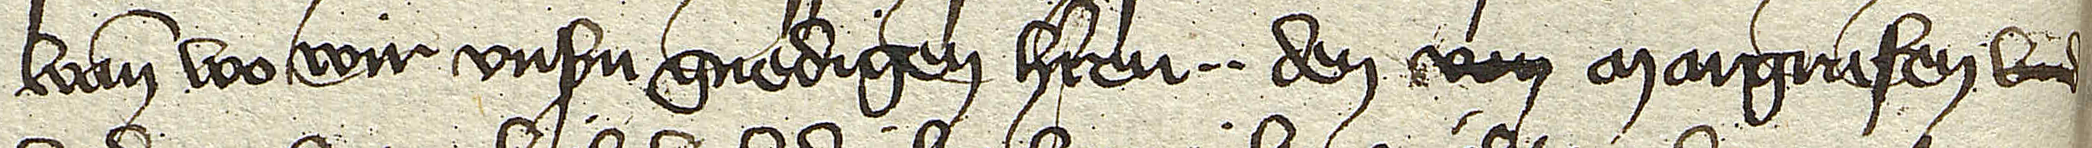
wan* wo wir vnſ*n gnedigen hr*en ~ den von Margrafen vnd
